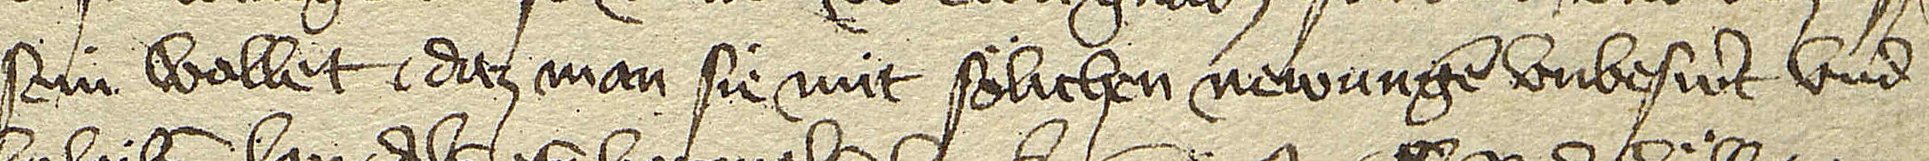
ſein wollet / daʒ man ſie mit ſölichen newunge* vnbeſwt* vnd
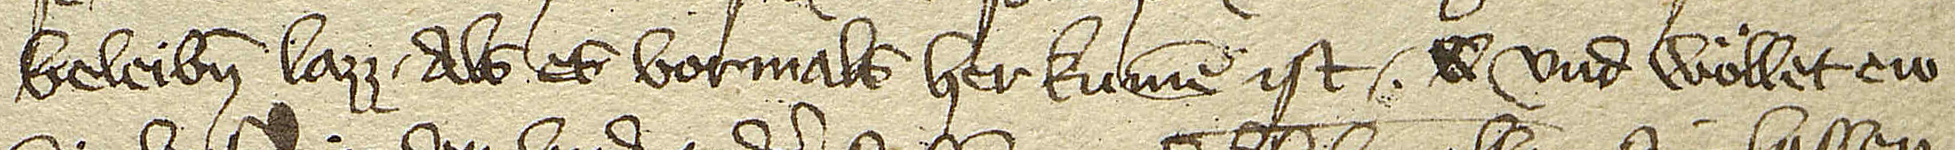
beleibn* laʒʒ / Als es vormals her kume* iſt / . w vnd wöllet ew
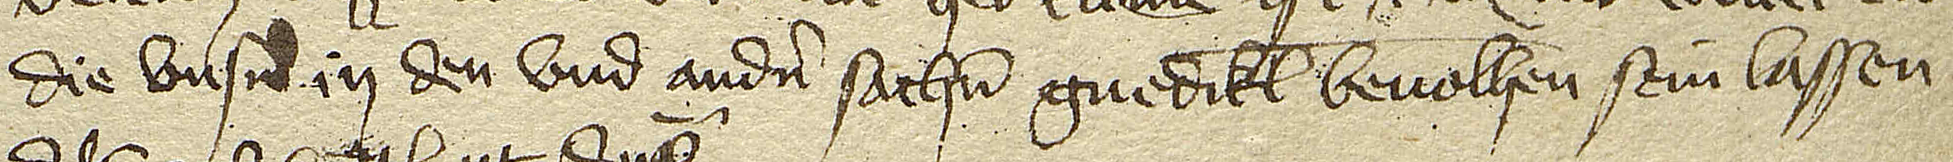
die vnſn* in den vnd andn* ſachn* gnedikl* beuolhen ſein laſſen
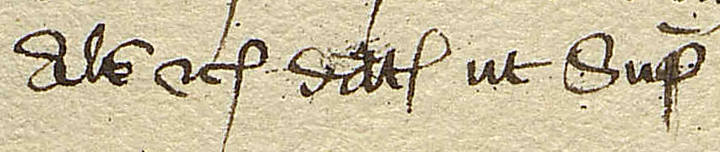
Als ec* dat* ut Sup*
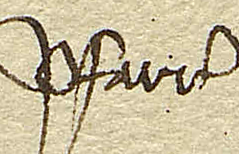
Pfarr*
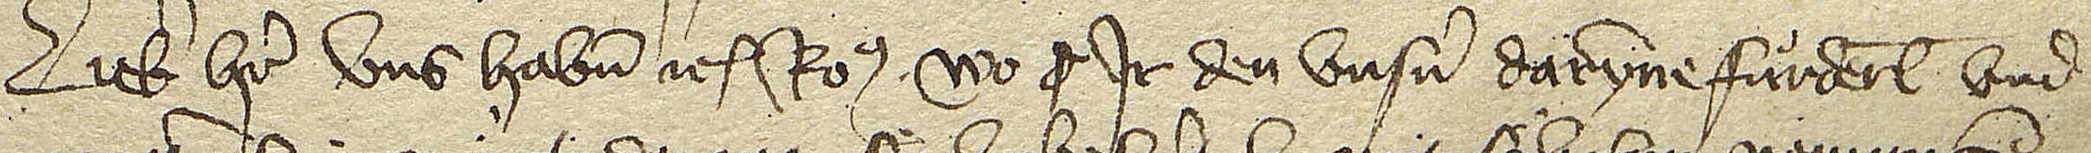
Lieb* hr* vns habn* ec* Ro* wo d Ir den vnſn* daryne* fürderl* vnd
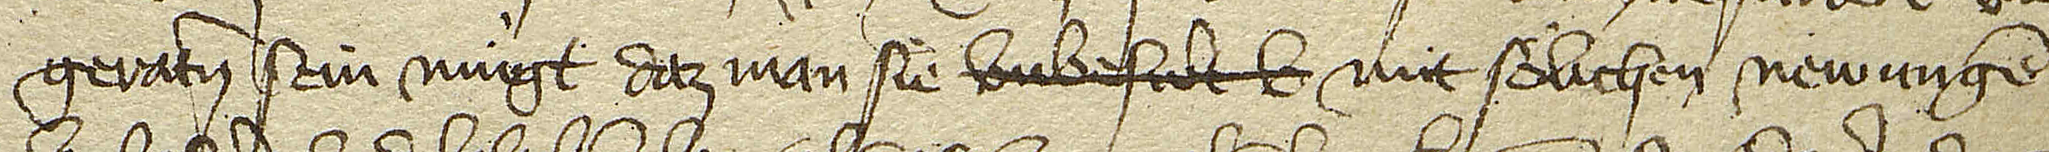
geratn* ſein mügt daʒ man ſie vnbeſwt* mit ſölichen newunge*
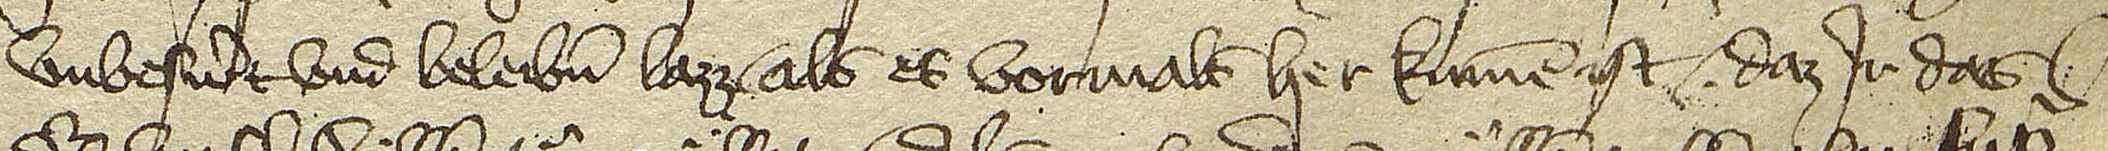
vnbeſw*t vnd beleibn* laʒʒ / als es vormals her kume* iſt / daʒ Ir das
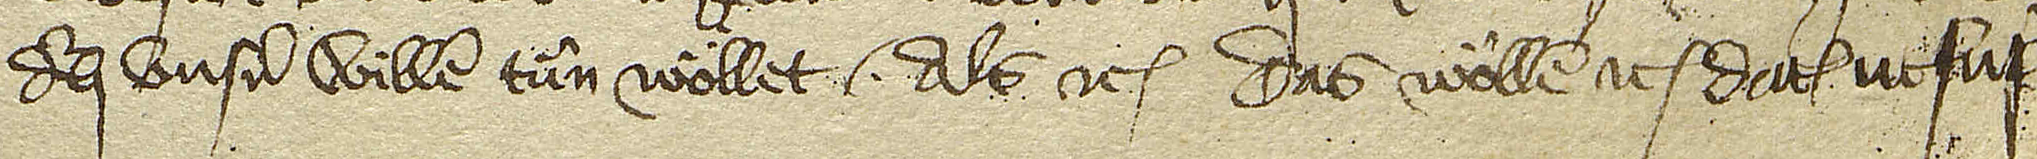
d*h vnſn* wille* tün wöllet / Als ec* Das wölle* ec* dat* ut ſup*
